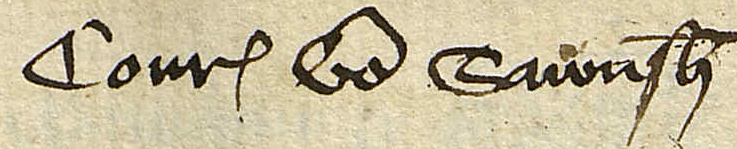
Conr* vo* Sawnſh*
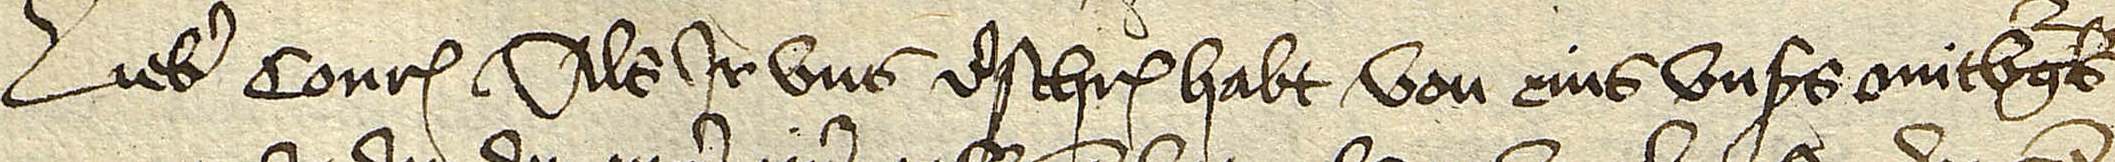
Lieb* Conr* / Als Ir vns v*ſchr* habt / von eins vnſ*s mitb*g*s
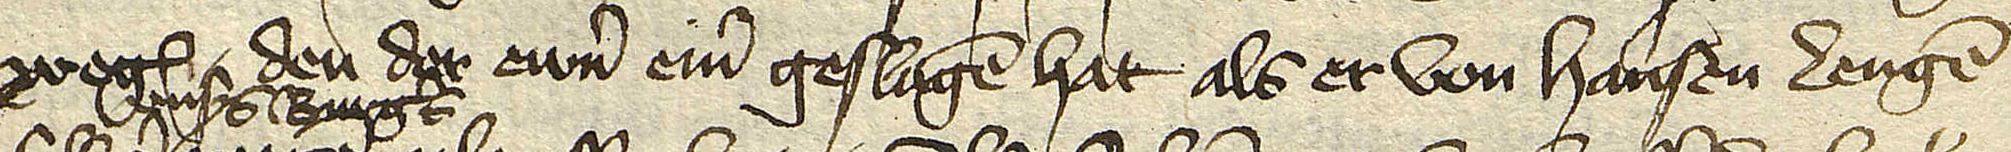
weg* / den der ewn* ein* geſlage* hat als er von hanſen lenge*
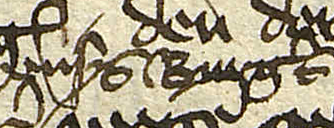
vnſ*s Burg*s
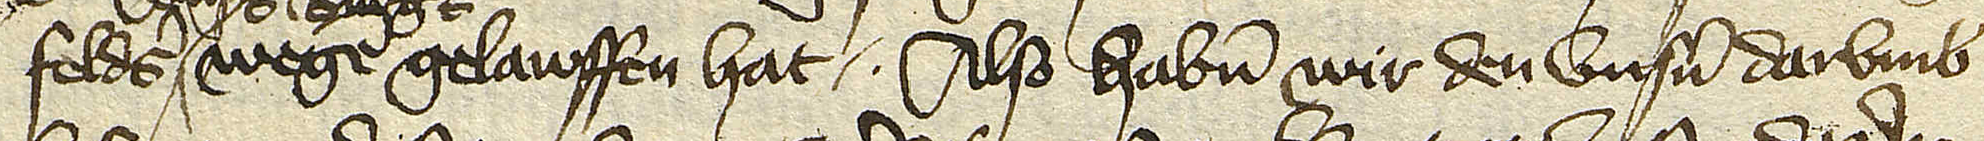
felds wege* gelawffen hat / . Alſo habn* wir den vnſn* darvmb
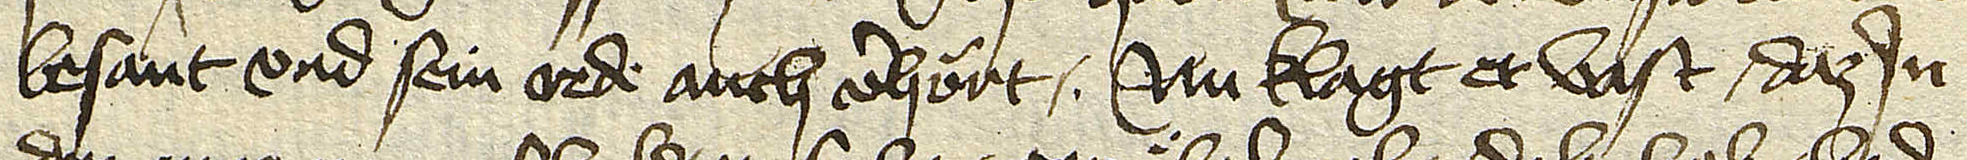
beſant vnd ſein rede auch v*hört / . Nu klagt er vaſt / daʒ In
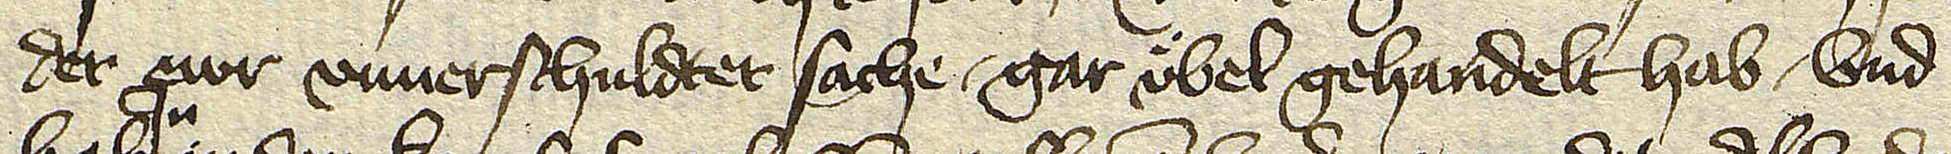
der ewr vnuerſchuldter ſache / gar v̈bel gehandelt hab / vnd
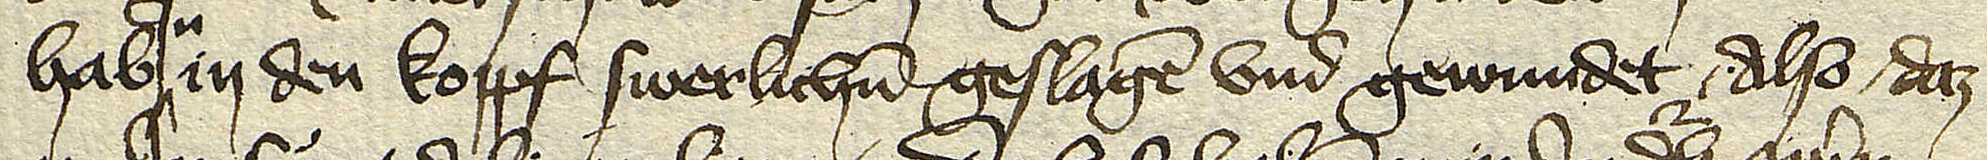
hab in den koppf ſwerlichn* geſlage* vnd gewundet / Alſo / daʒ
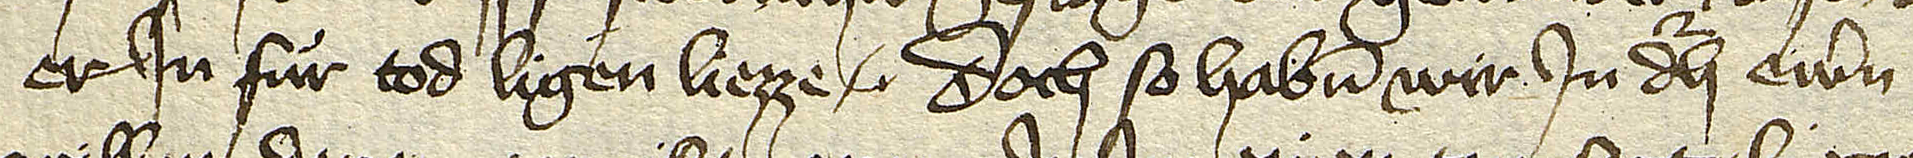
er In für tod ligen lieʒʒe / . Doch ſo habn* wir In d*h ew*n
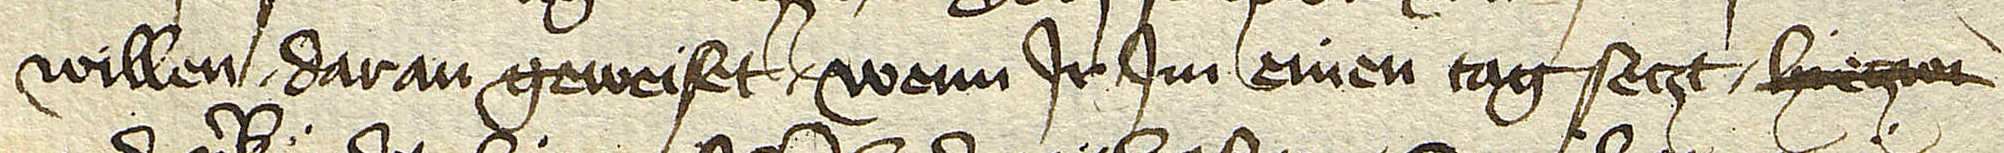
willen / daran geweiſet / wenn Ir Im einen tag ſecʒt / hiecʒwi
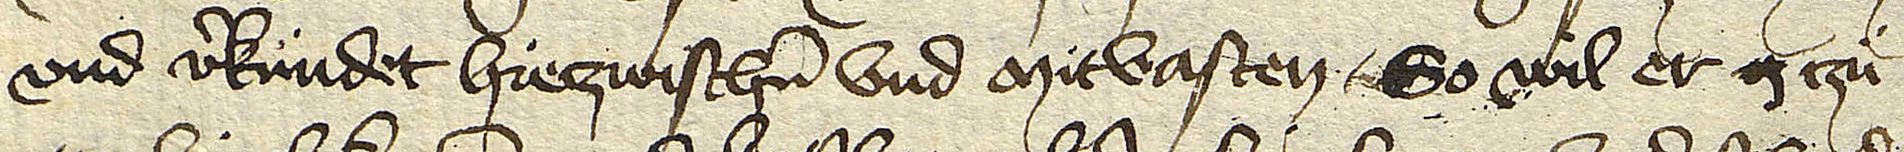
vnd v*kündet hiecʒwiſchn* vnd Mitvaſten / So wil er % cʒü
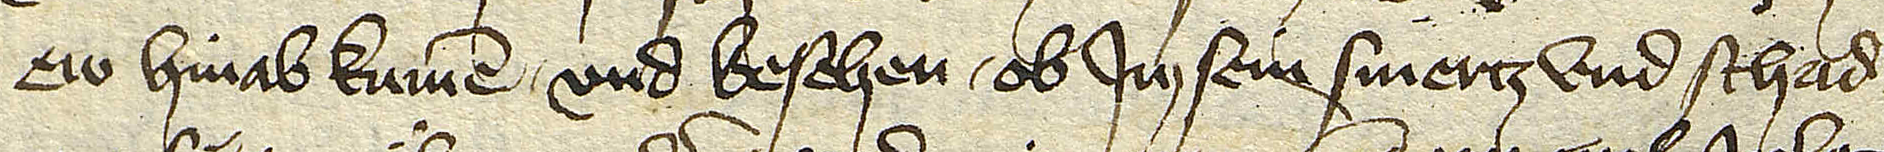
ew hinab kume* / vnd beſehen / ob Im ſein ſmercʒ vnd ſchad
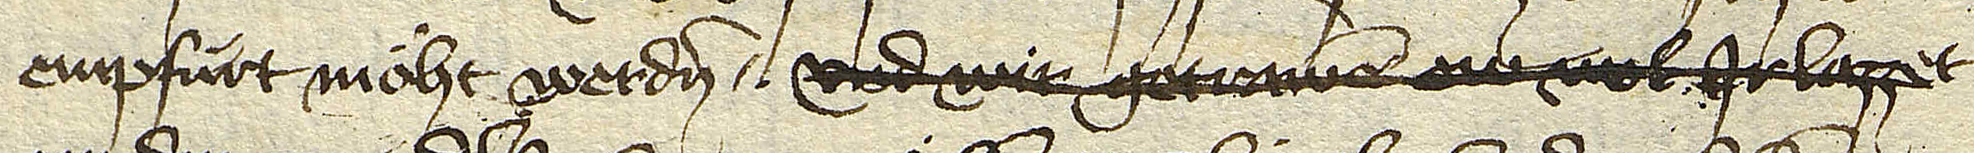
empfürt möht werdn* / . vnd wir getrawe* ew wol Ir laʒʒet
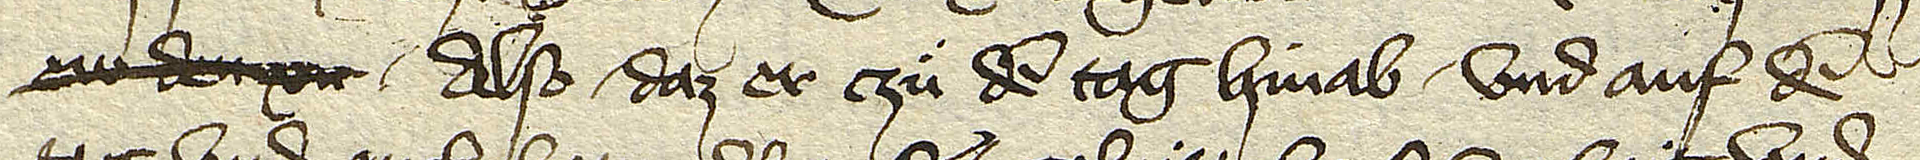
ew den %% / Alſo / daʒ er cʒü d* tag hinab / vnd auf d*
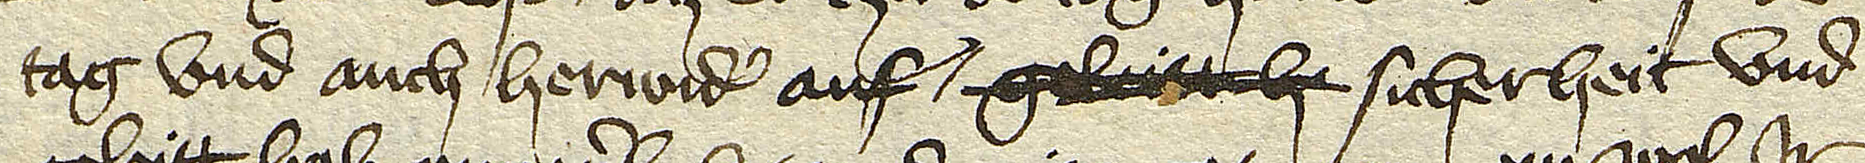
tag vnd auch herwid* auf / geleitt h ſicherheit vnd
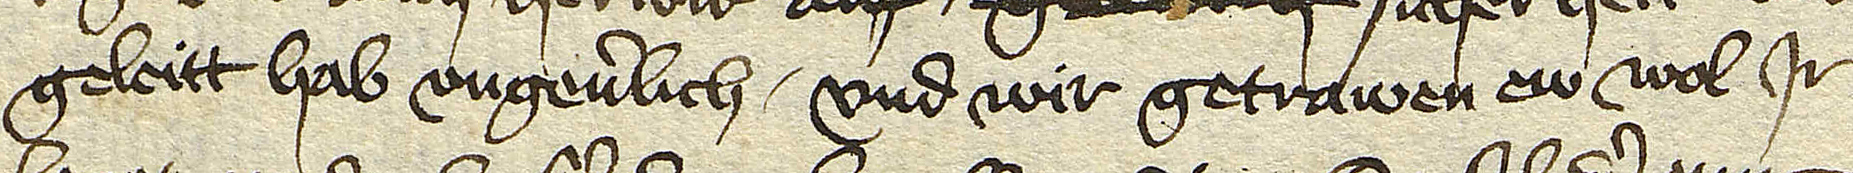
geleitt hab vngeu*lich / vnd wir getrawen ew wol Ir
